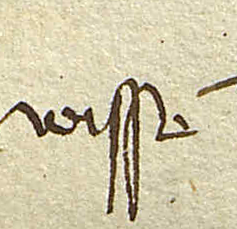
wiſſe
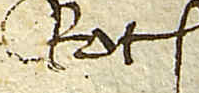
Rot*
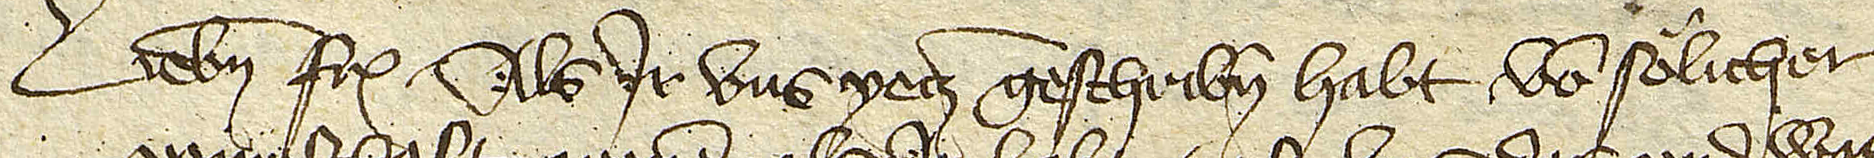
Liebn* fr* / Als Ir vns yecʒ* geſchribn* habt / vo* ſölicher
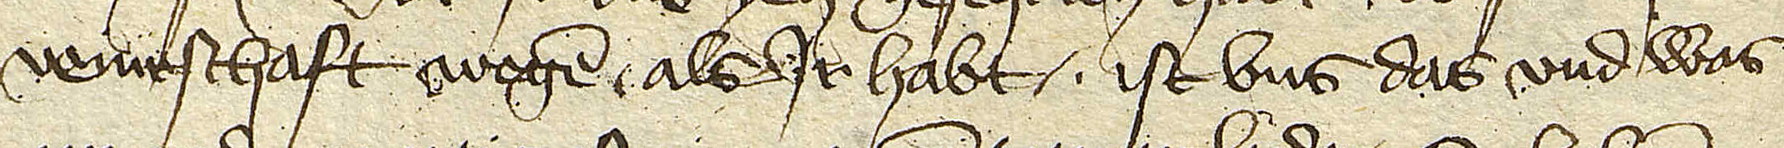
veintſchaft wege* / als Ir habt / . iſt vns das vnd was
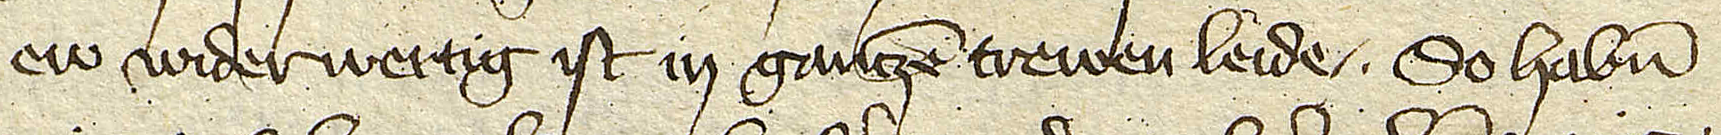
ew widerwertig iſt in gancʒe* trewen leide / . So habn*
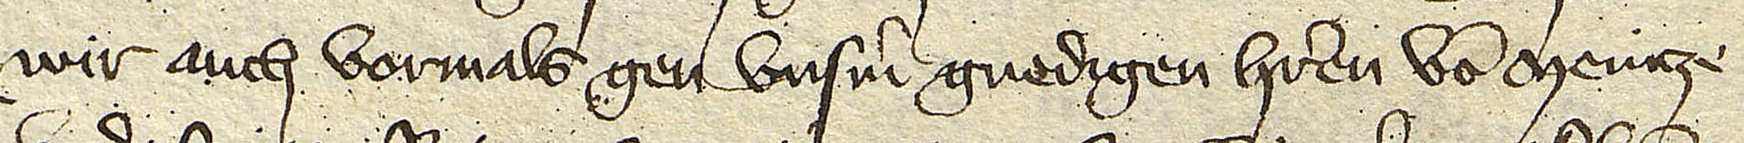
wir auch vormals gen vnſm* gnedigen hr*en vo* Meincʒe
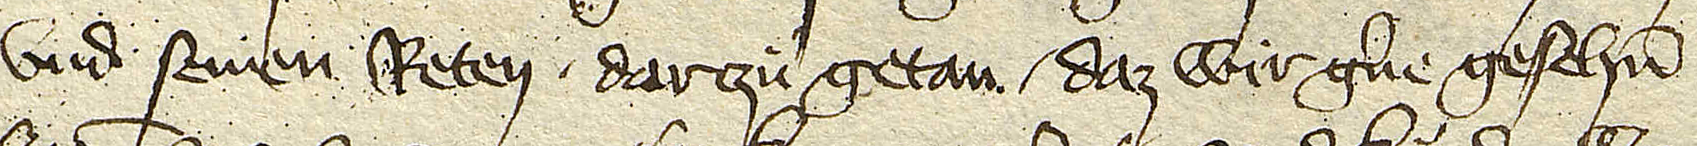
vnd ſeinen Reten / darcʒü getan / daʒ wir g*ne geſehn*
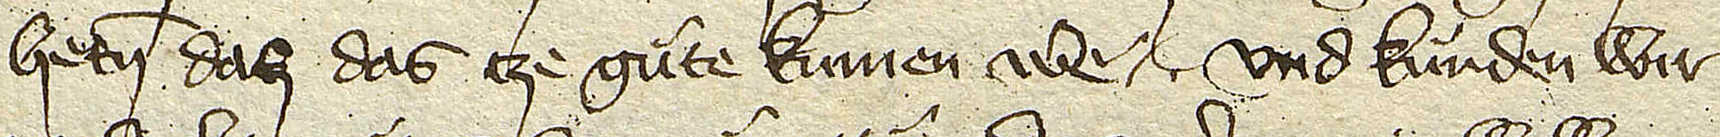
hetn* daʒ das cʒe güte kumen w*e / . vnd künden wir
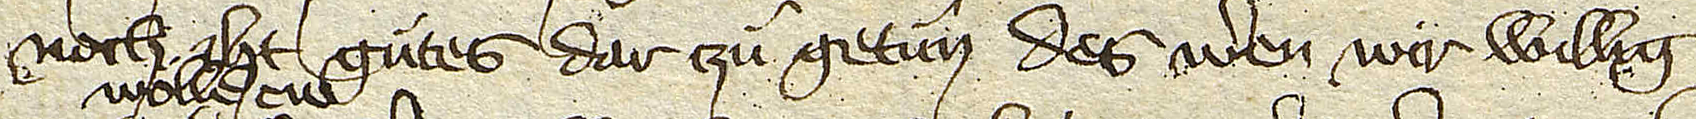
noch iht gütes dar cʒü getün Des w*en wir willig
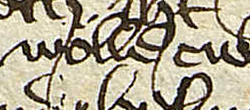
wölle* ew
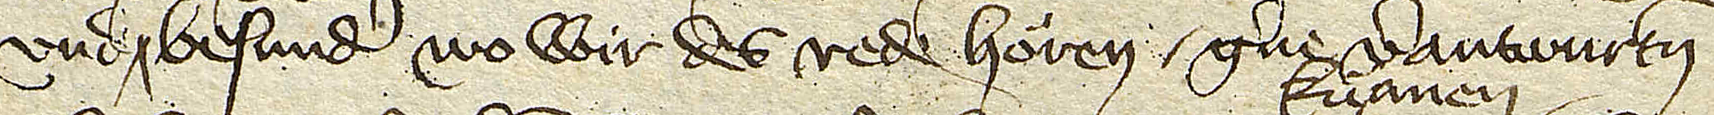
vnd beſund* wo wir des rede hören / g*ne v*antwurtn*
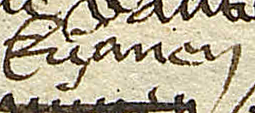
künnen
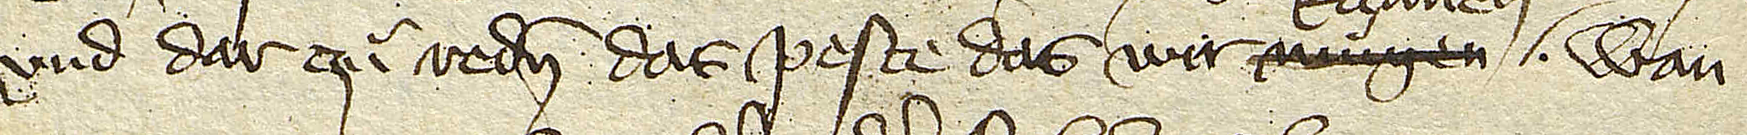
vnd dar cʒü redn* das peſte das wir mügen / . wan
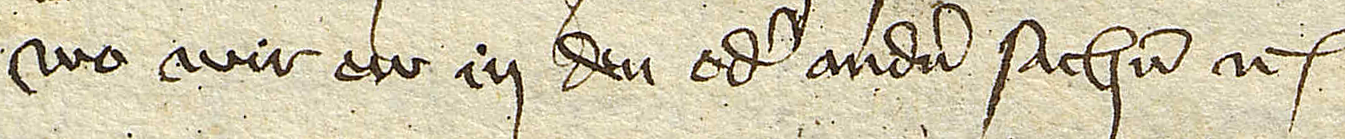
wo wir ew in den od* andn* ſachn* ec*
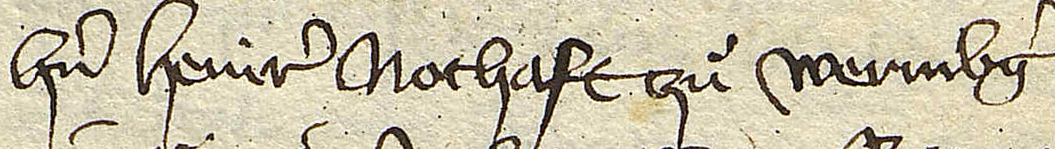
hn* heinr* Nothaft cʒü wermbg*
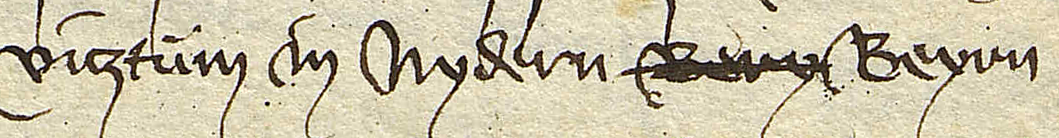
vicʒtüm in Nydern Bery Beyrn
